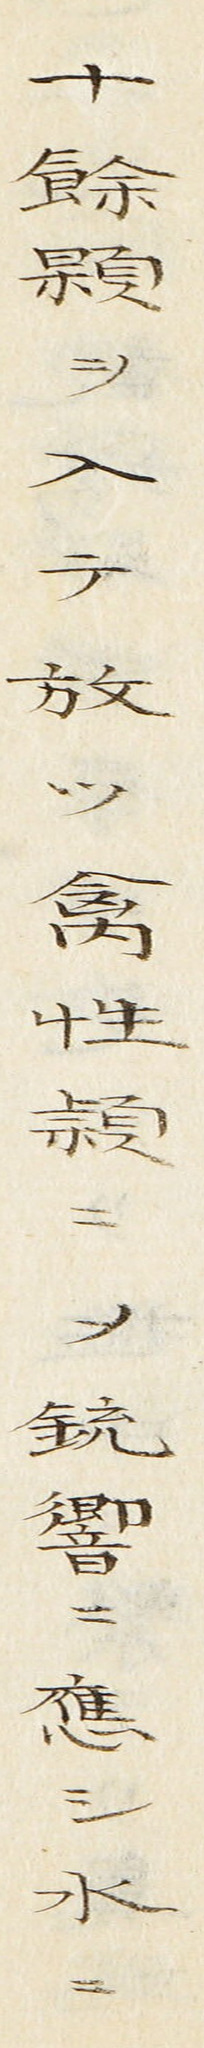十余顆ヲ入テ放ツ禽性頴ニシテ銃響ニ応シ水ニ
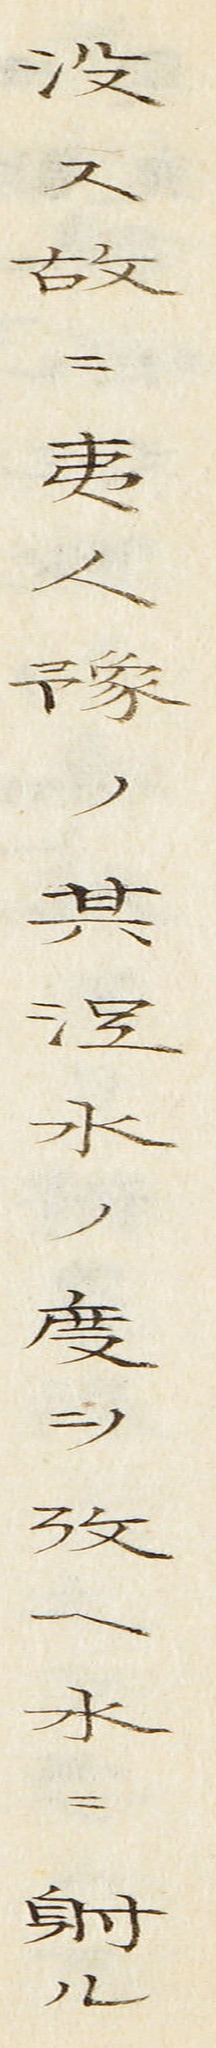没ス故ニ夷人予ノ其浞？水ノ度ヲ攷ヘ水ニ射ル
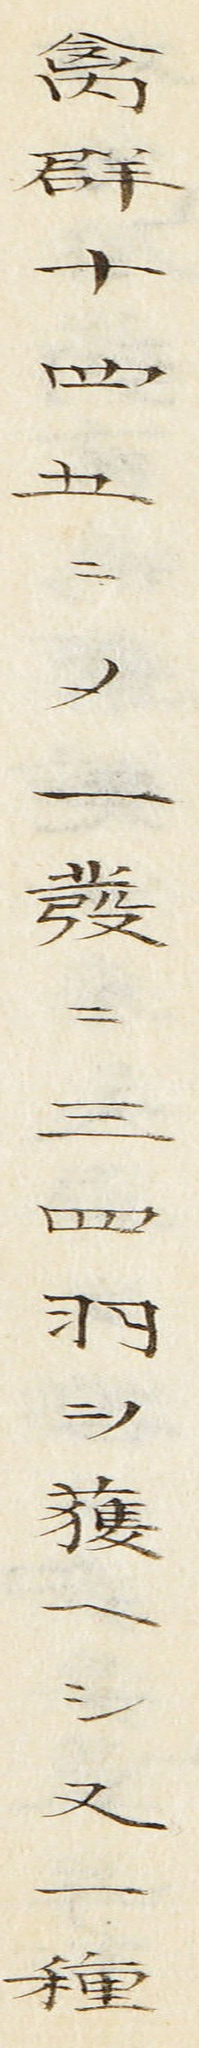禽群十四五ニシテ一発ニ三四羽ヲ獲ヘシ又一種
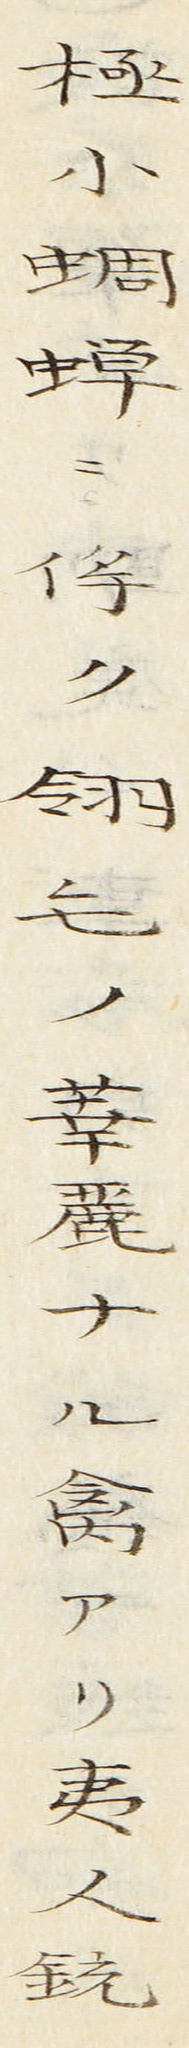極小蜩蝉ニク翎毛ノ華麗ナル禽アリ夷人銃
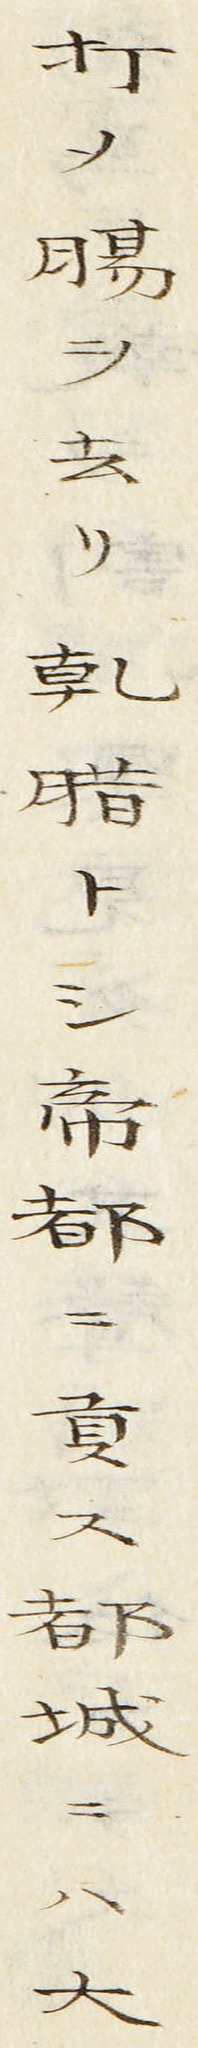打シテ腸ヲ去リ乾腊トシ帝都ニ貢ス都城ニハ大
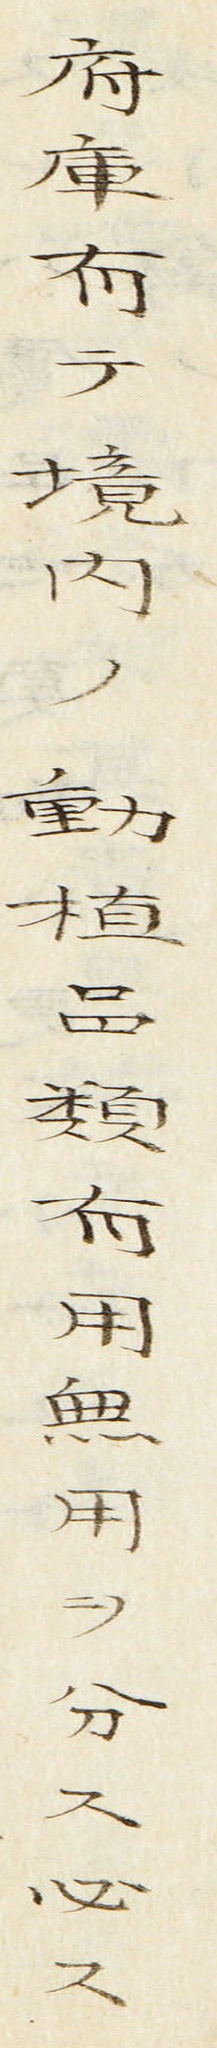府庫有テ境内ノ動植品類有用無用ヲ分ス必ス
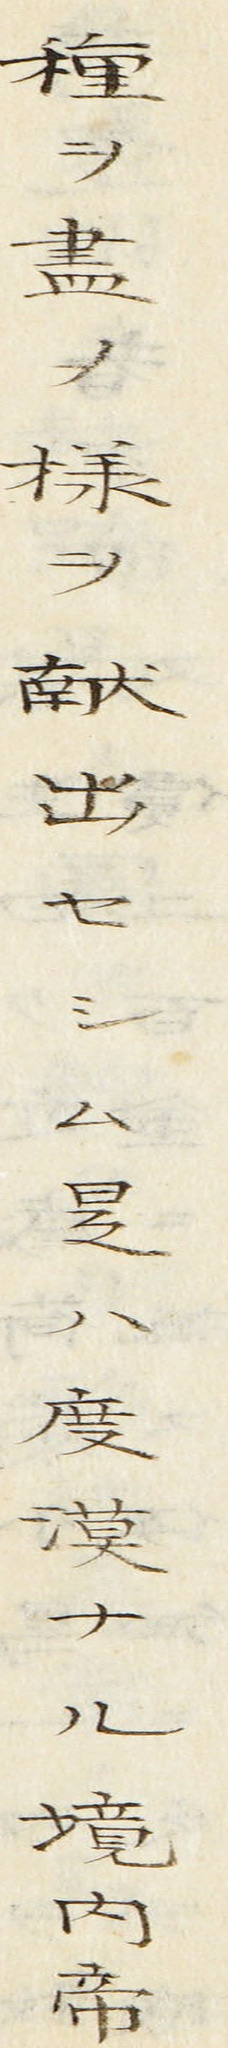種ヲ画シテ様ヲ献出セシム是ハ度漠ナル境内帝
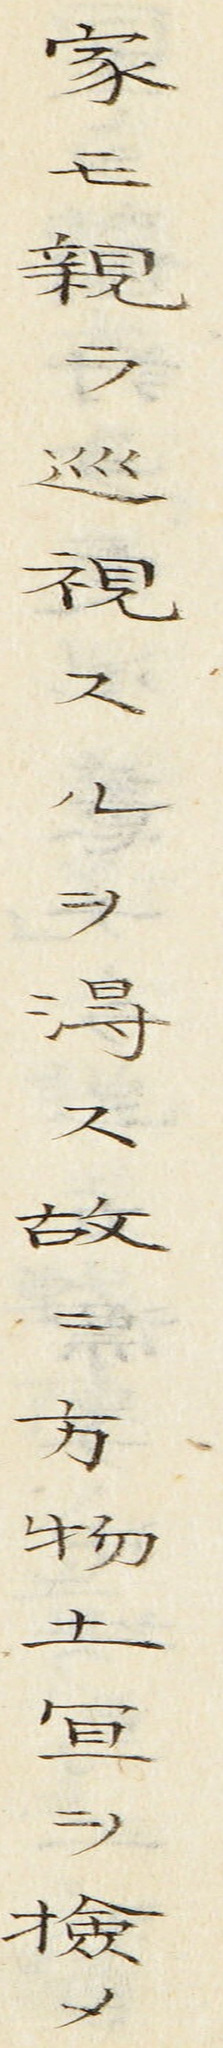家モ親ラ巡視スルヲ得スう故ニ方物土ヲ検メ

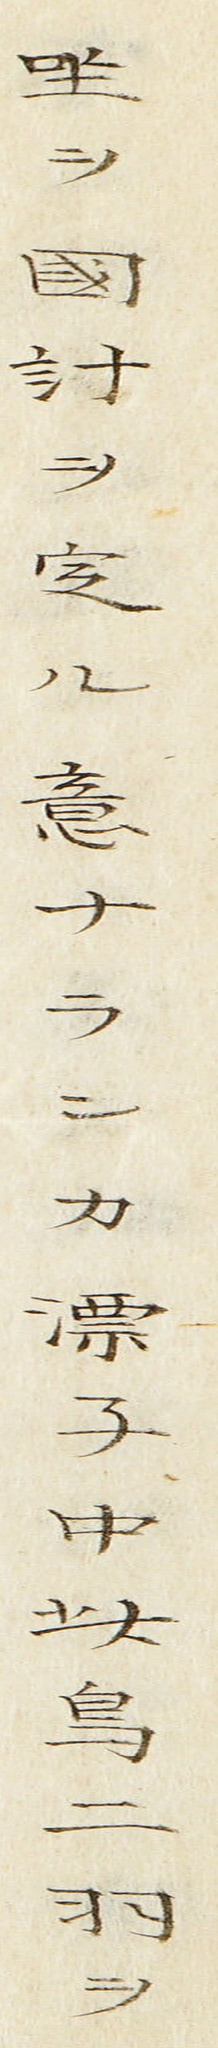座ヲ国計ヲ定ル意ナランカ漂子中此鳥二羽ヲ
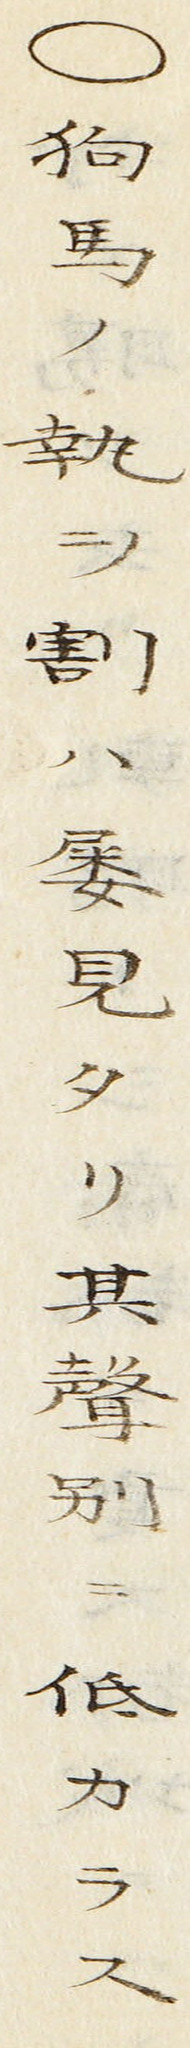〇狗馬ノ執ヲ割ハ屡見タリ其声別ニ低カラス
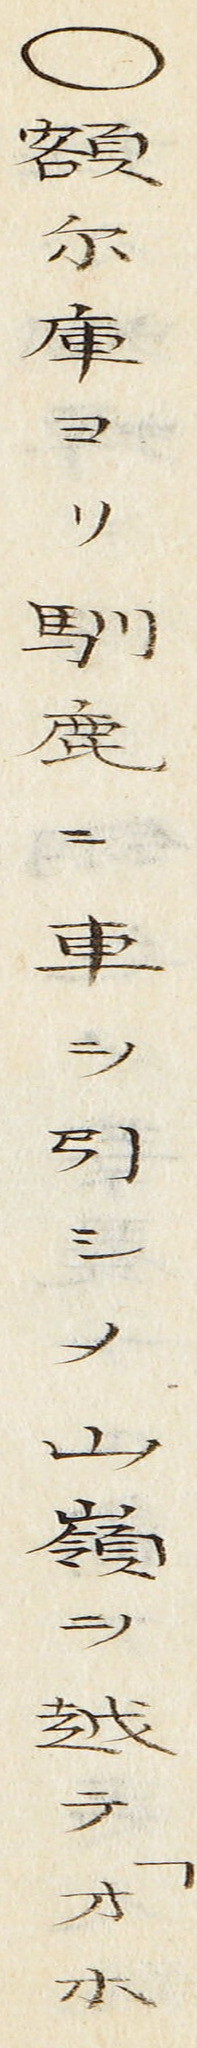〇額尓庫ヨリ馴鹿ニ車ヲ引シメ山嶺ヲ越テ「オホ
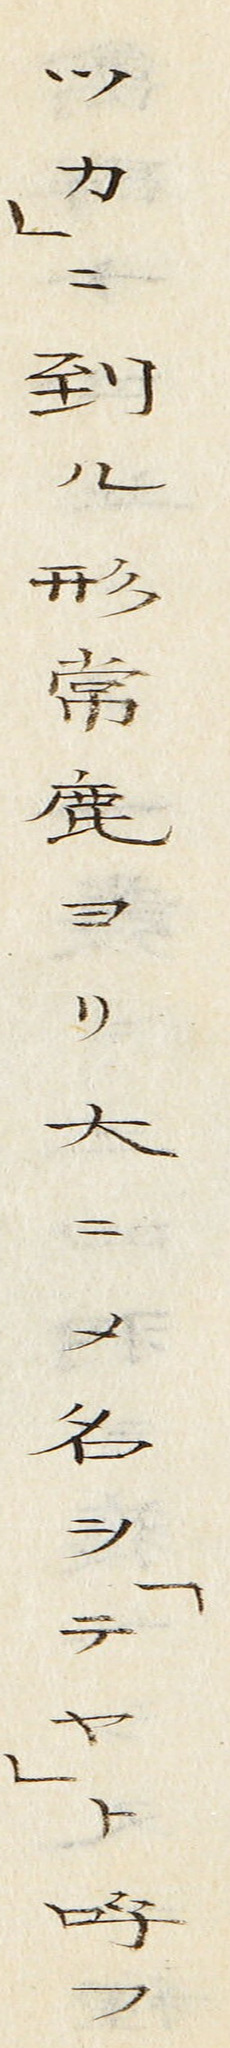ツカ」ニ到ル形常鹿ヨリ大ニシテ名ヲ「テヤ」ト呼フ
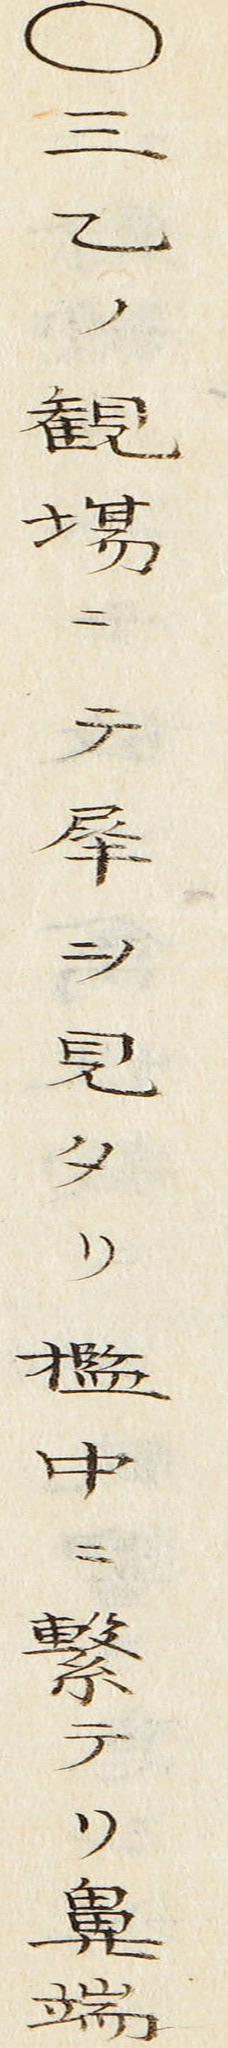〇三乙ノ観場ニテ犀ヲ見タリ檻中ニ繋テリ鼻端
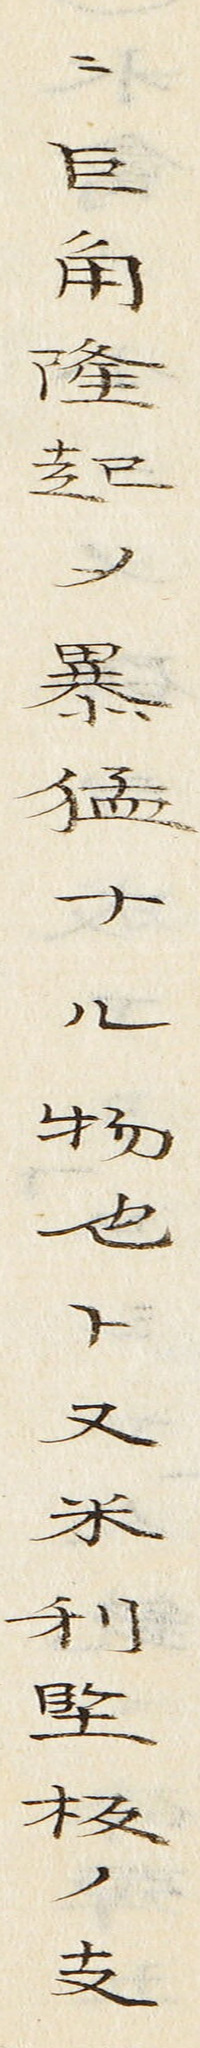ニ巨角隆起シテ暴猛ナル物也ト又米利堅板ノ支
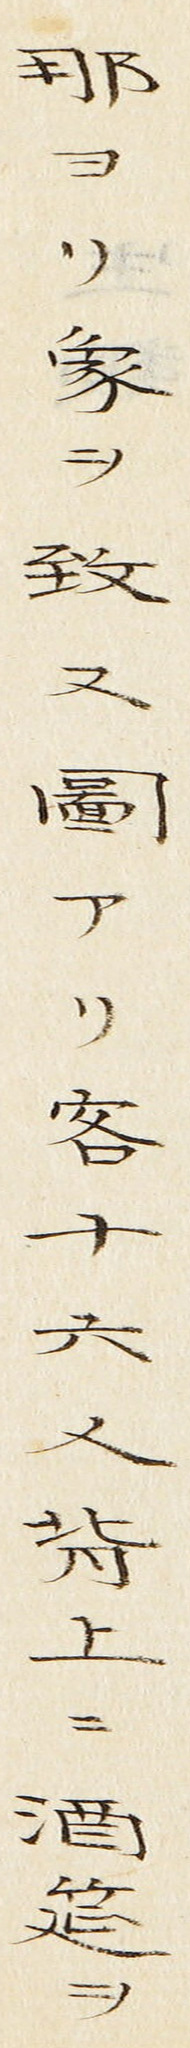那ヨリ象ヲ致ス図アリ客十六人背上ニ酒筵ヲ
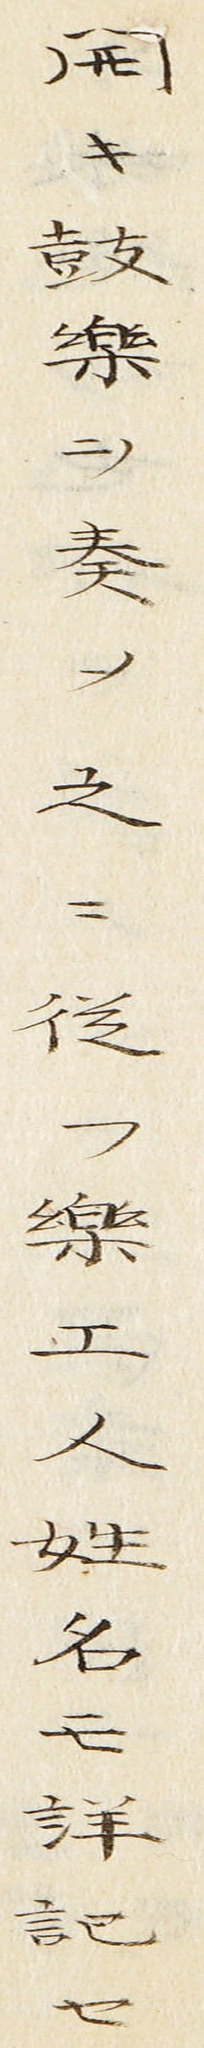開キ鼓楽ヲ奏シテ之ニ従フ楽工人姓名モ詳記セ
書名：蕃談
